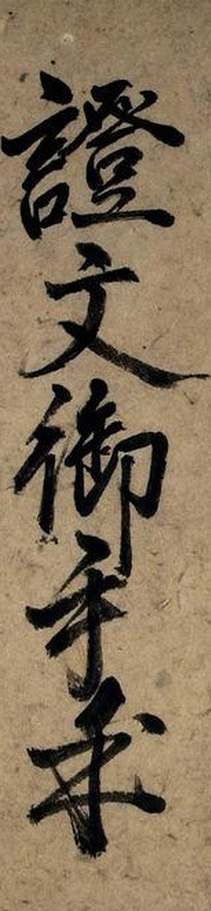証文御手本
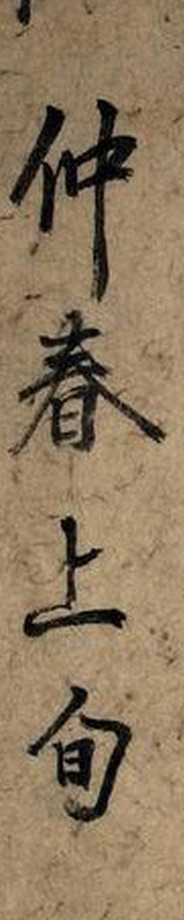仲春上旬

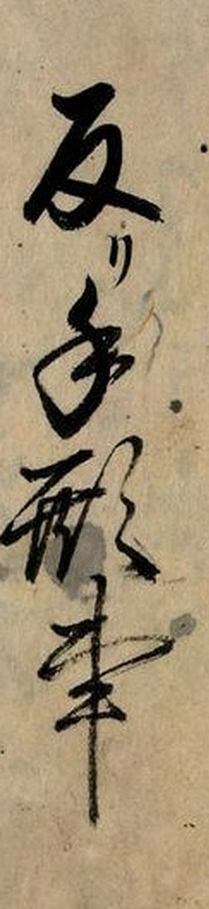反リ手形事
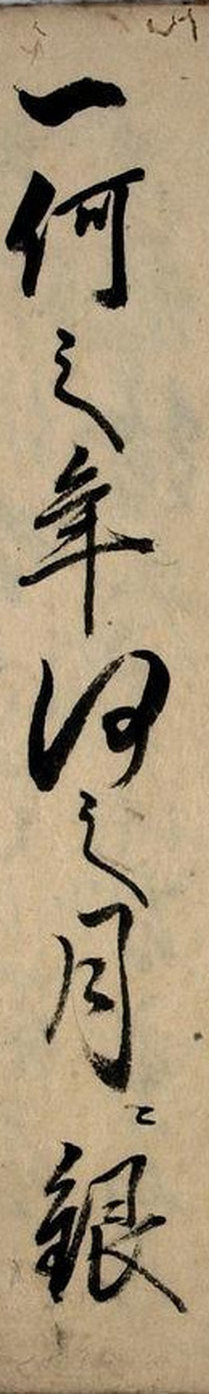一何之年何之月ニ銀
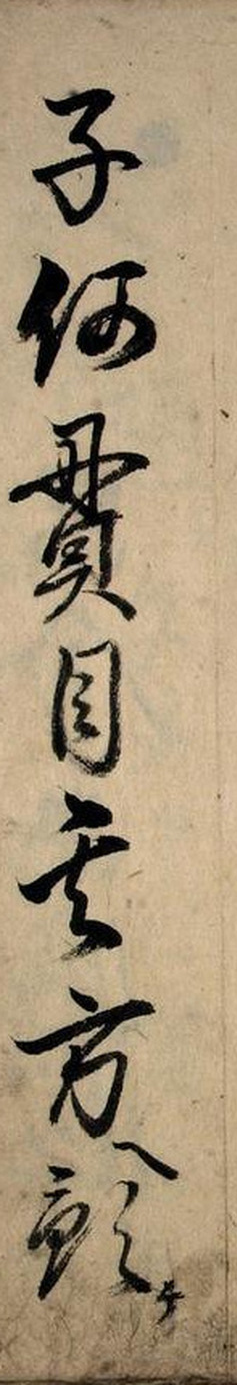子何貫目其方へ預ヶ

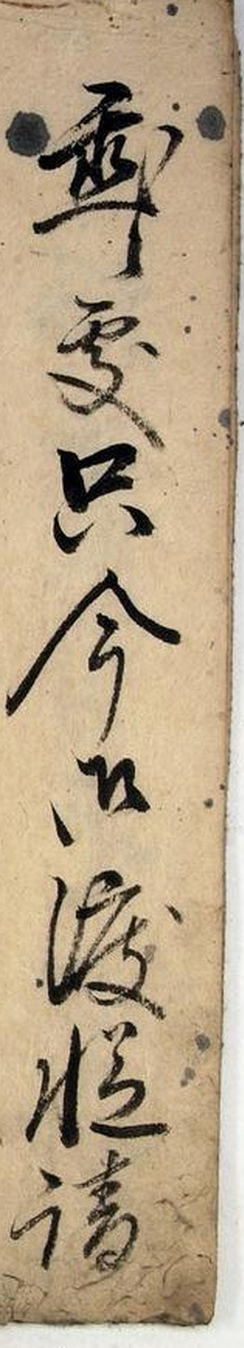置候処只今御渡慥請
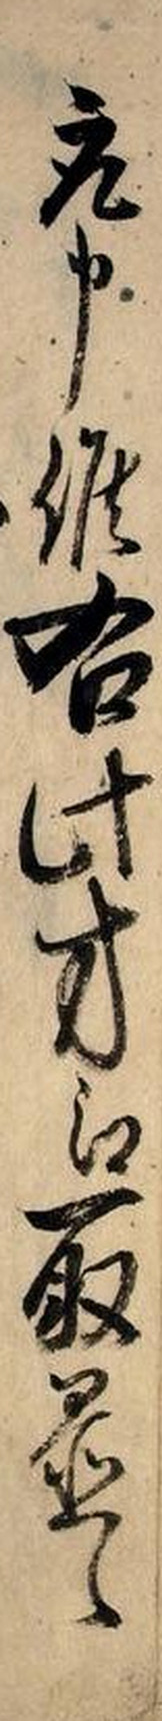取申候右此方え取置候
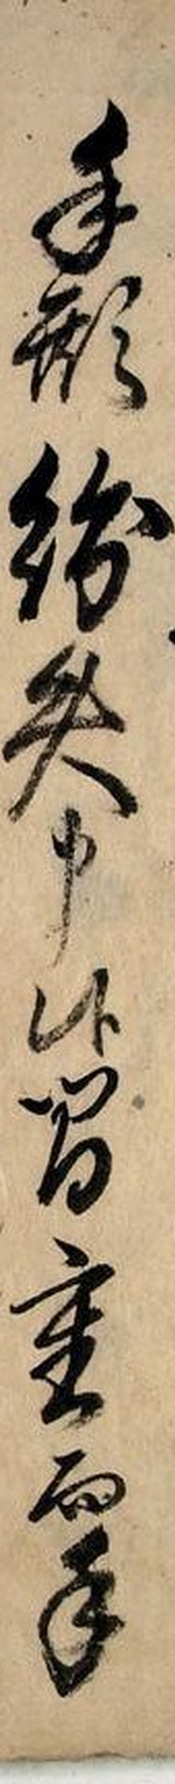手形紛失申候間重而手
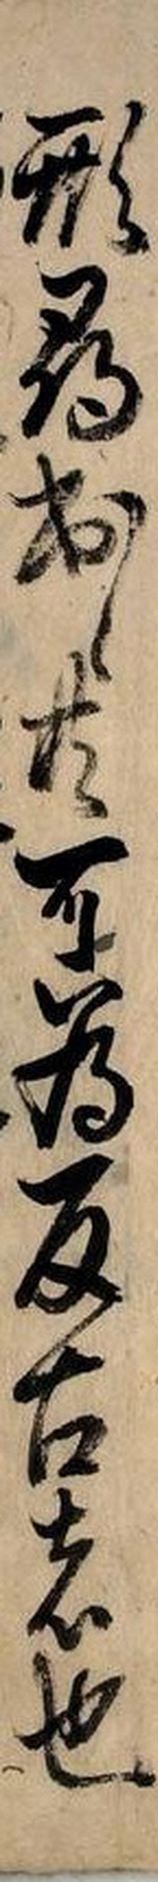形尋出候共可為反古者也
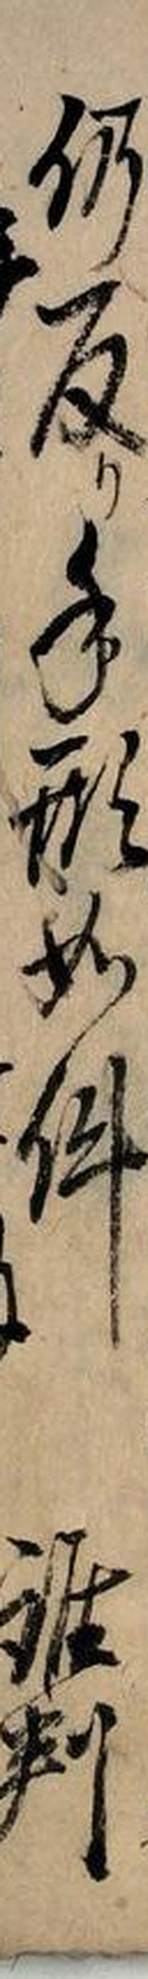仍反リ手形如件誰判
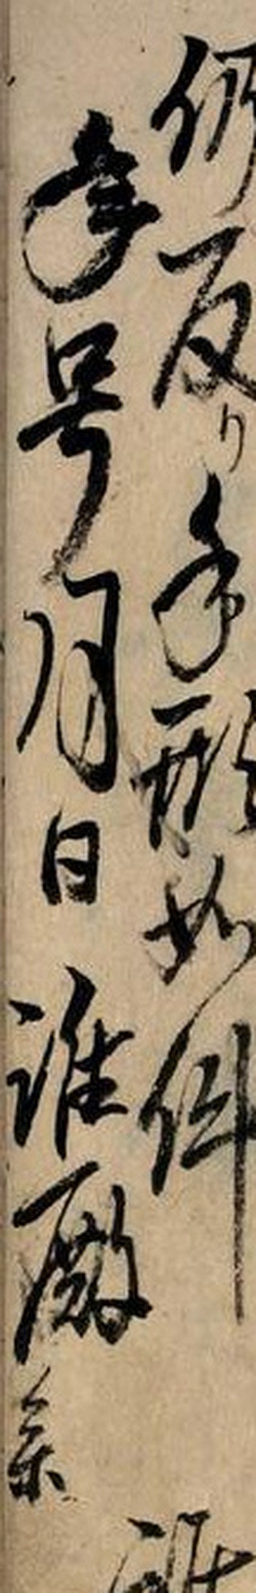年号月日誰殿参
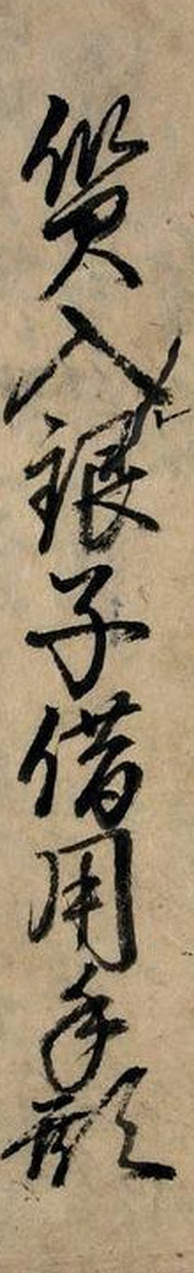質入銀子借用手形
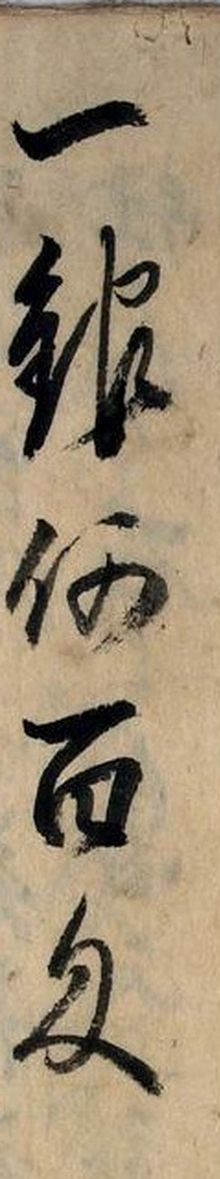一銀何百匁
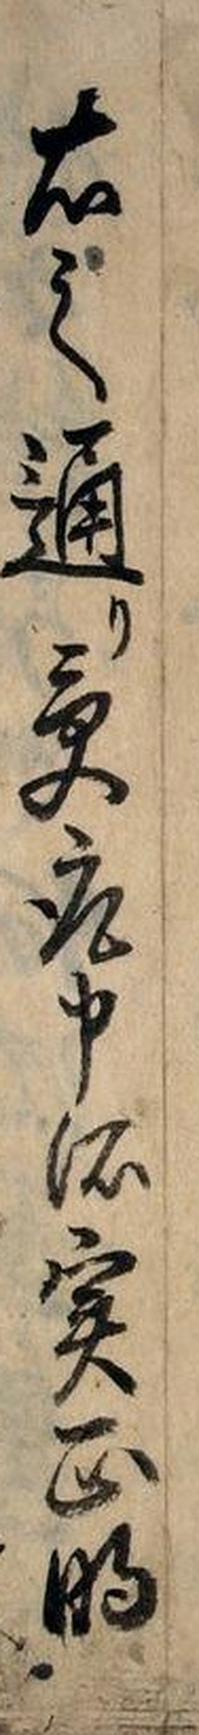右之通リ受取申所実正明
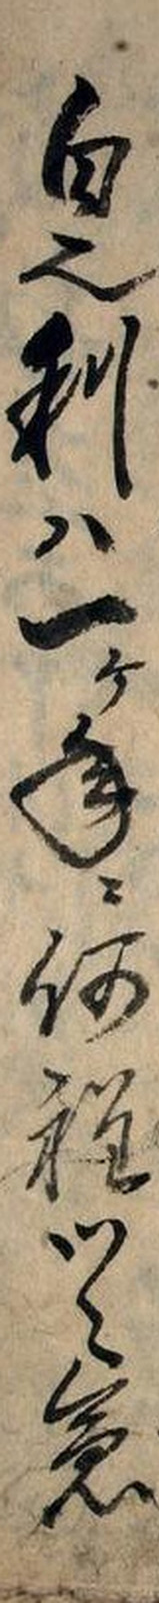白也利は一ヶ年ニ何程ツゝ急

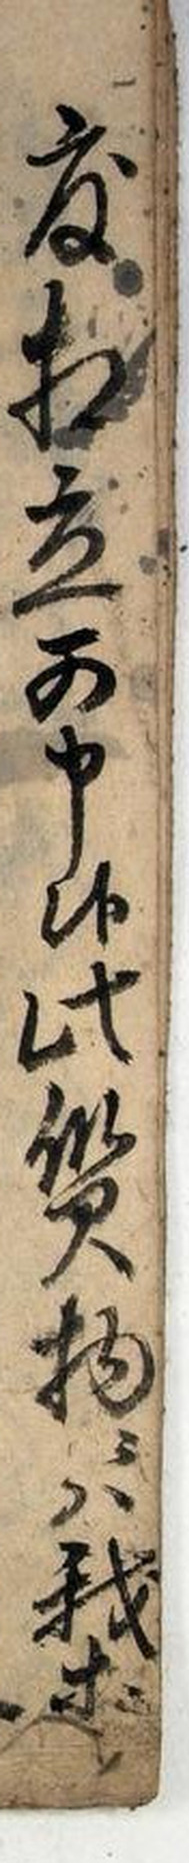度相立可申候此質物ニは我等
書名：証文御手本（手習）
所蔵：福井県文書館 Fukui Prefectural Archives
